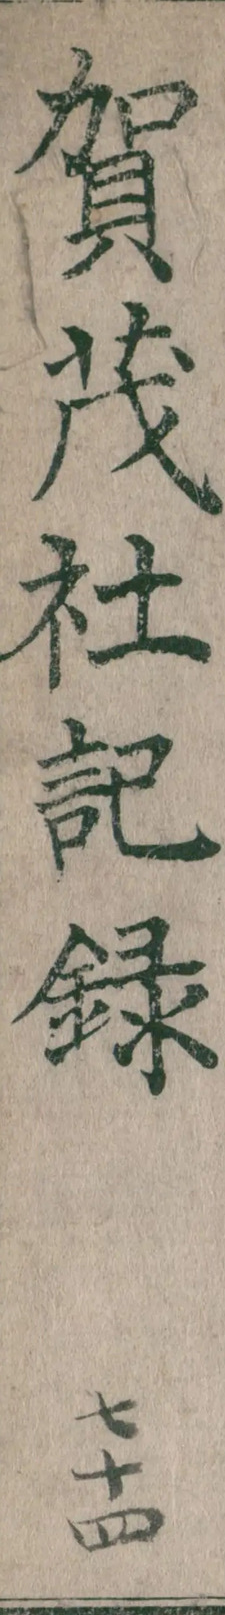賀茂社記録全七十四

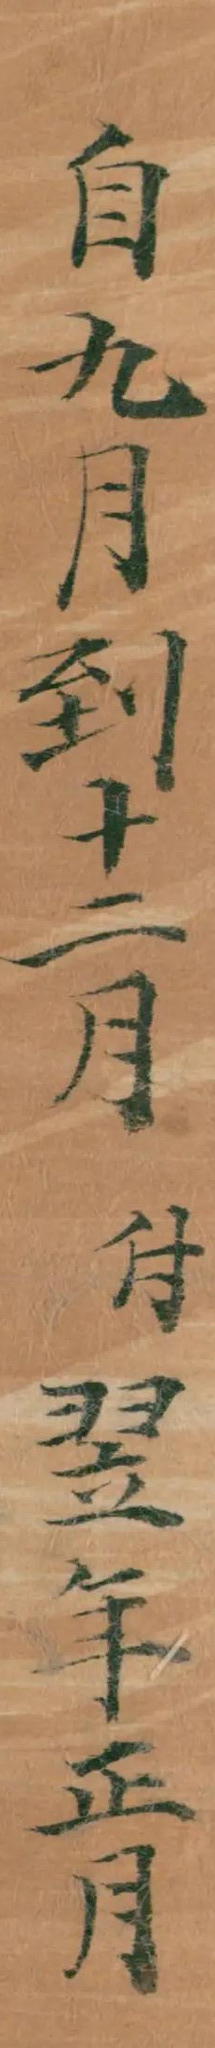自九月到十二月付翌年正月
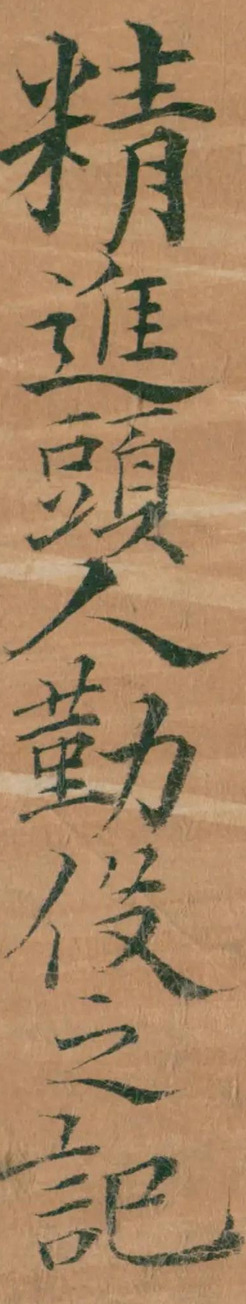精進頭人勤役之記人
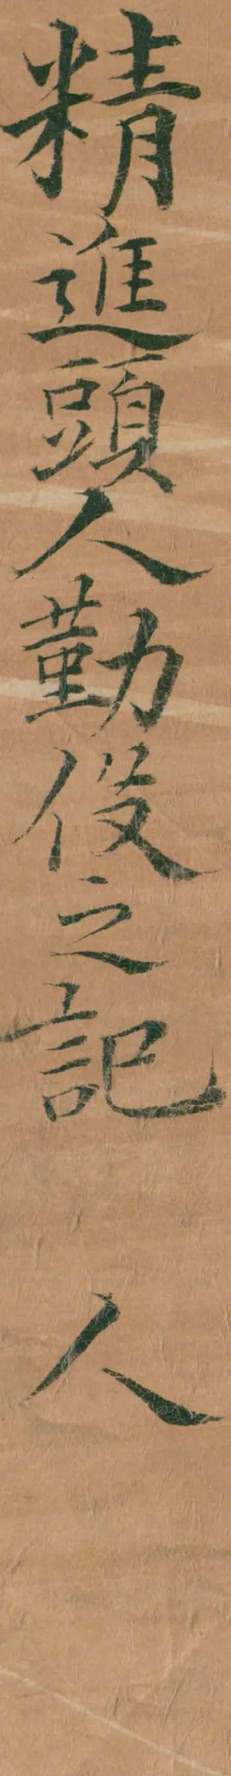精進頭人勤役之記人

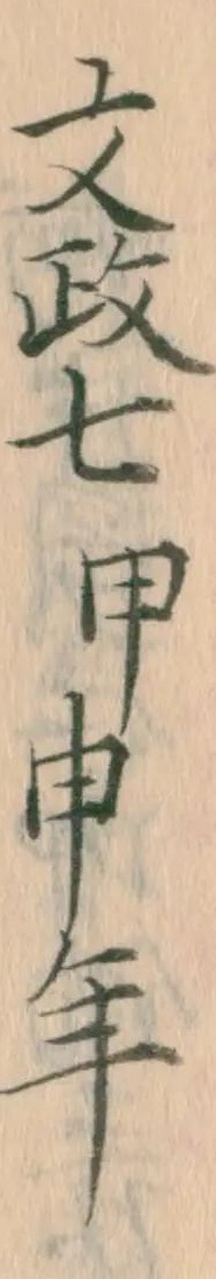文政七甲申年
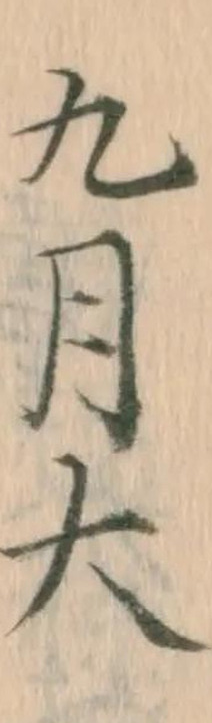九月大
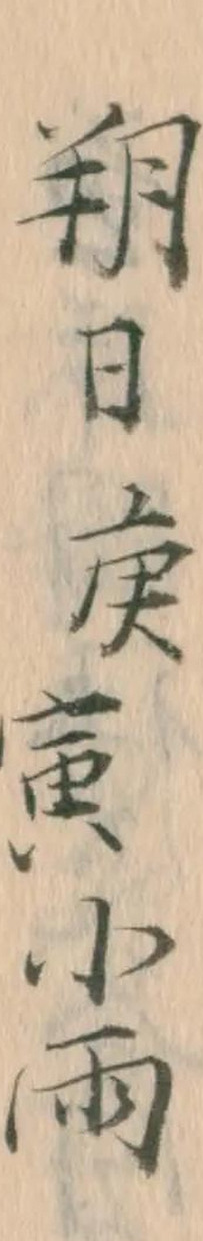朔日庚寅小雨
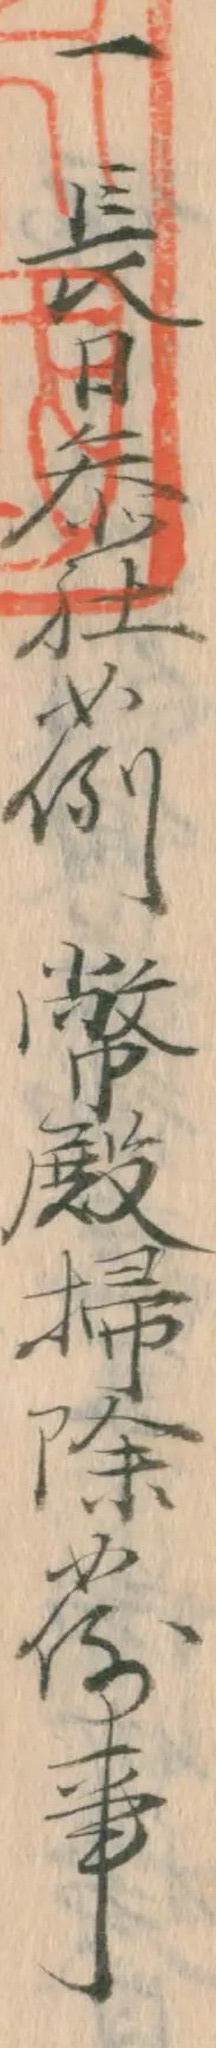一長日参社如例幣殿掃除如例事
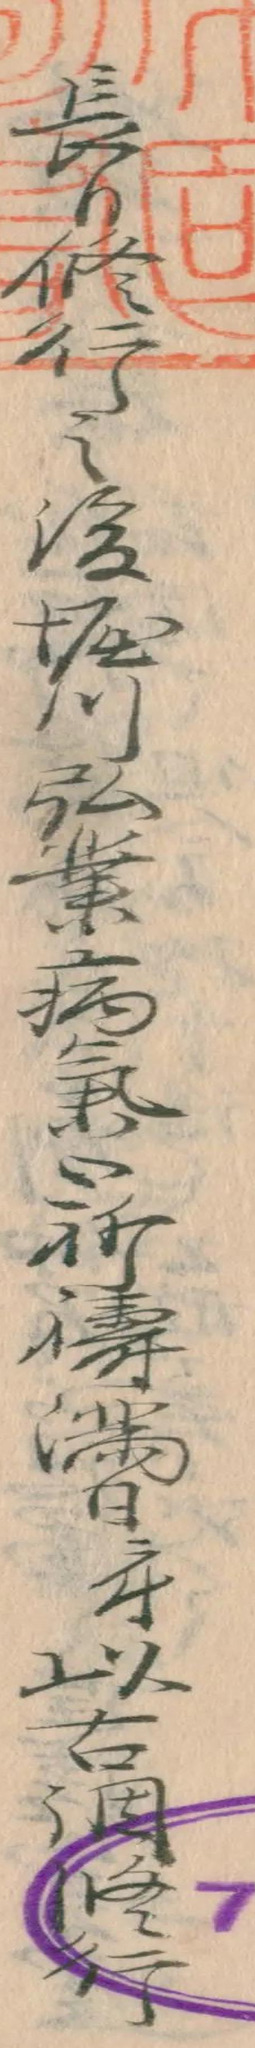一長日修行之後堀川弘業病氣御祈祷満日ニ付以古調修行
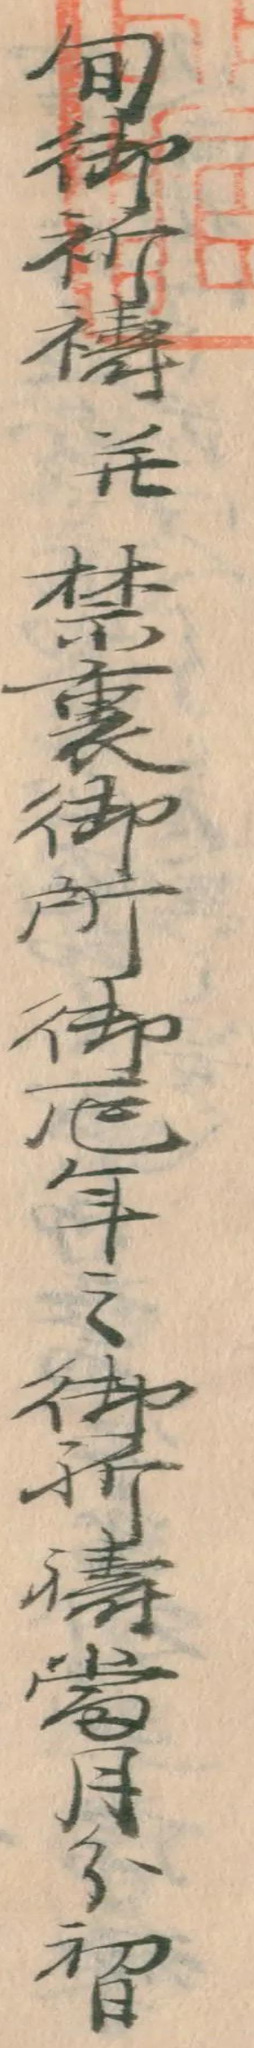一旬御祈祷幷禁裏御所御厄年之御祈禱當月分初日
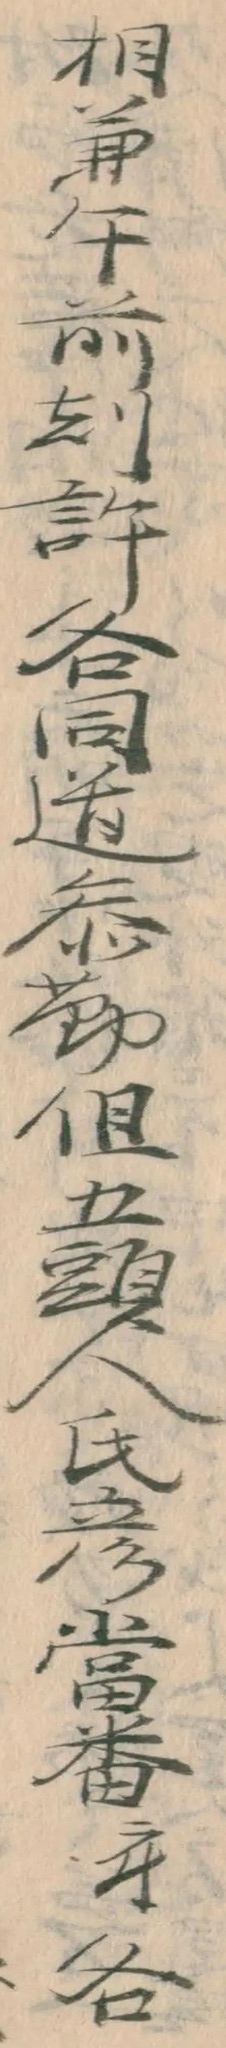相兼午前刻許各同道参勤但五頭人氏彦當番ニ付各

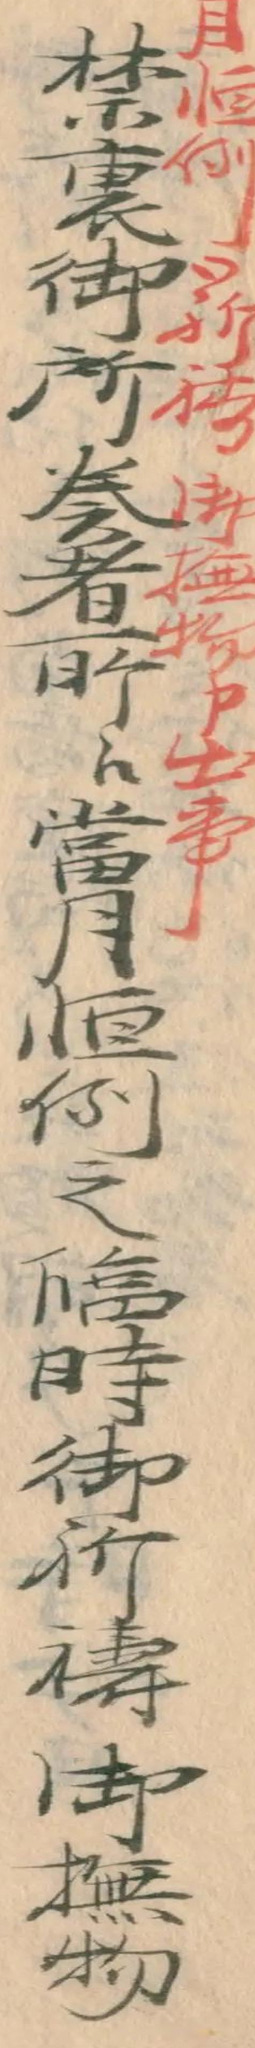禁裏御所奏者所え當月恒例之臨時御祈祷御撫物
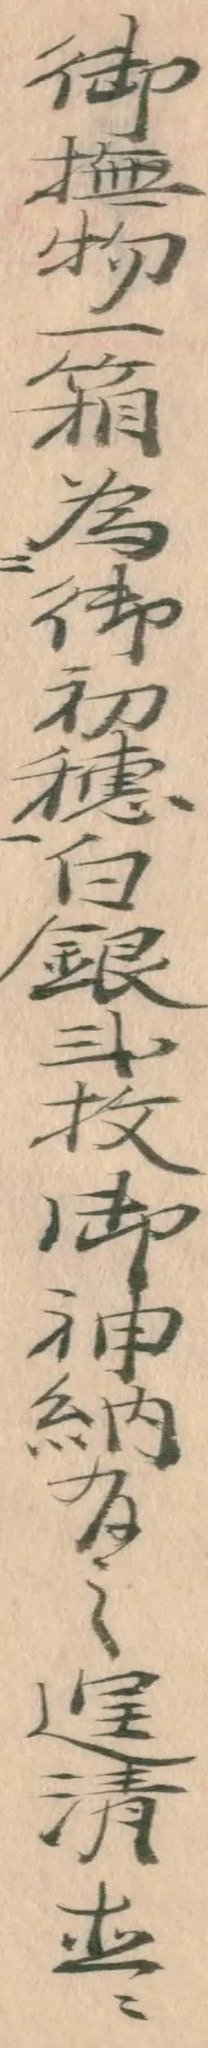御撫物一箱為御初穂白銀弐枚御神納有之逞清直ニ
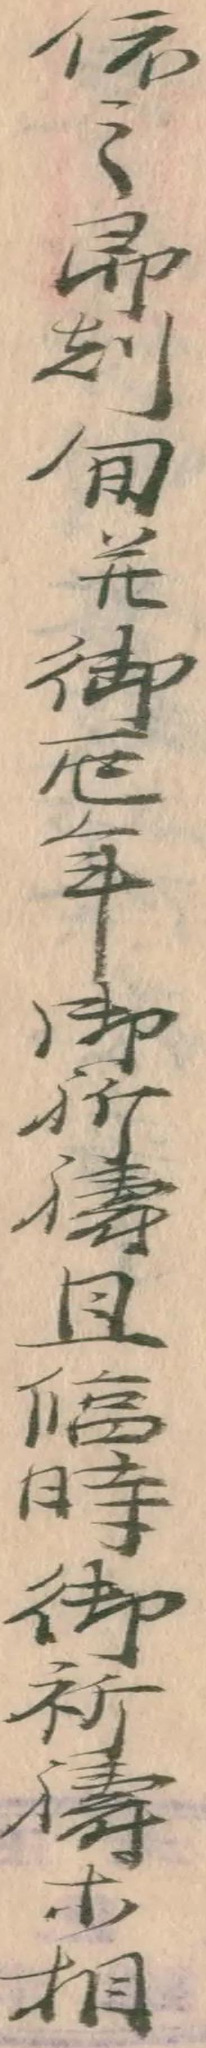依之即刻旬并御厄年御祈祷且臨時御祈禱等相
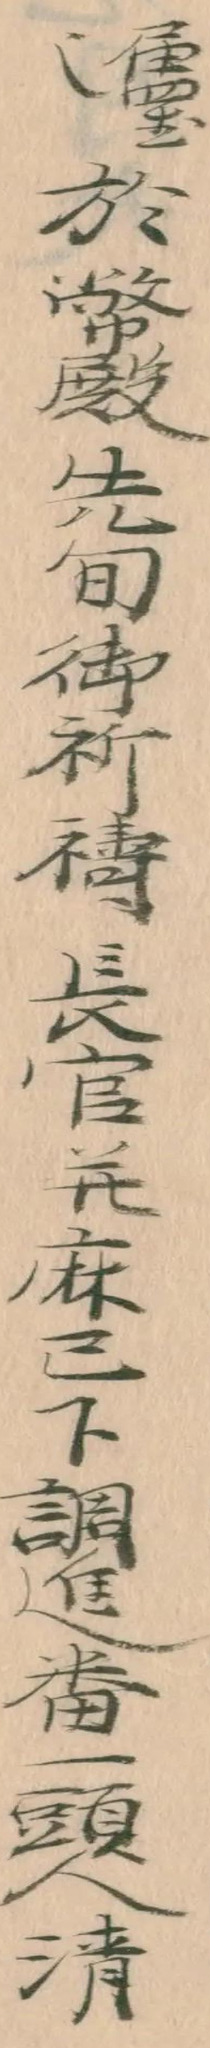届置也於幣殿先旬御祈祷長官并麻已下調進番一頭人清
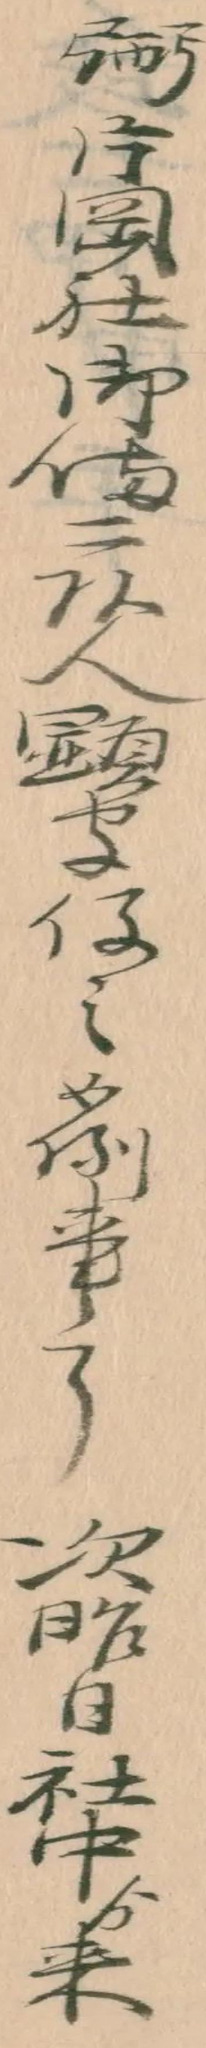弼片岡社御備二頭人顕守役之如例書了次昨日社中ゟ来
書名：賀茂社記録. 第74冊
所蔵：国立国会図書館 National Diet Library, JAPAN
